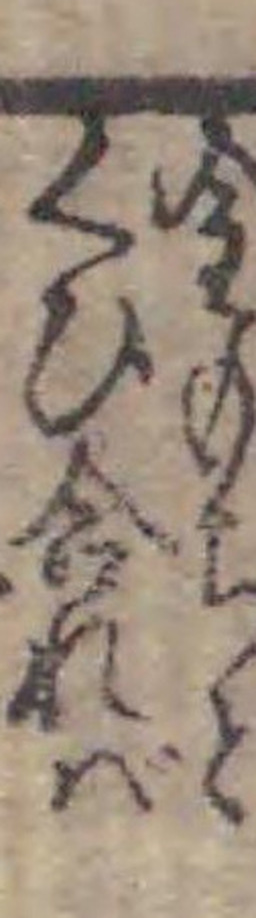くひ合れば
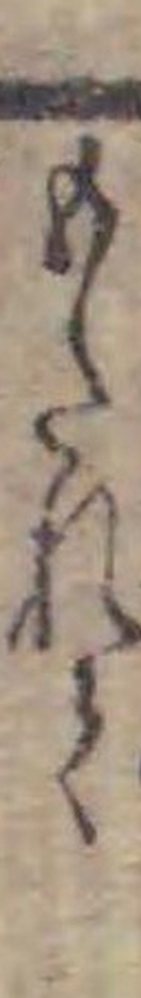もたれて
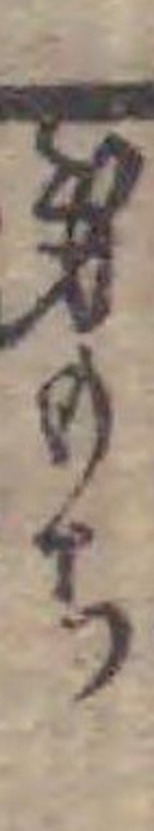身もち
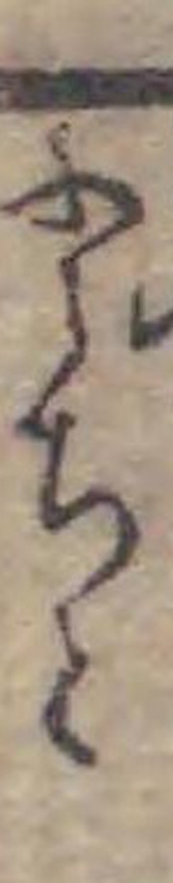ふらちと
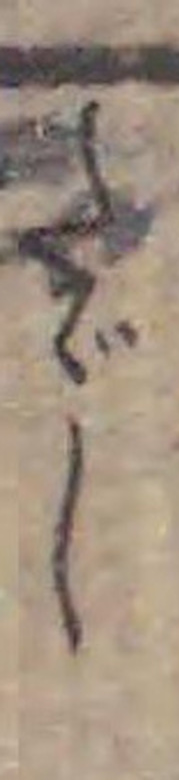たゞし
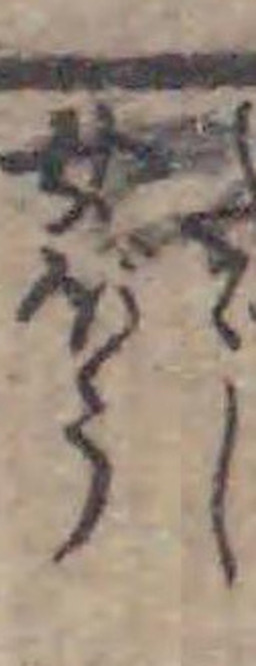女ぼう
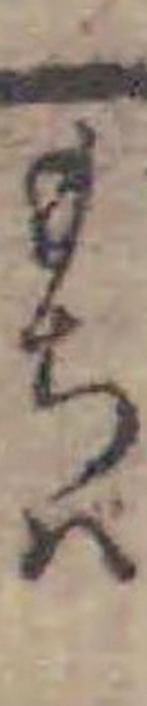もちは
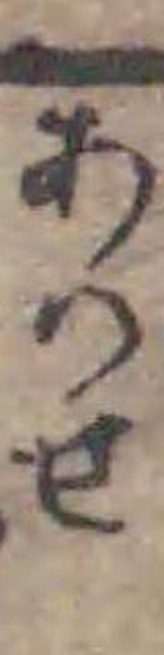あはせ
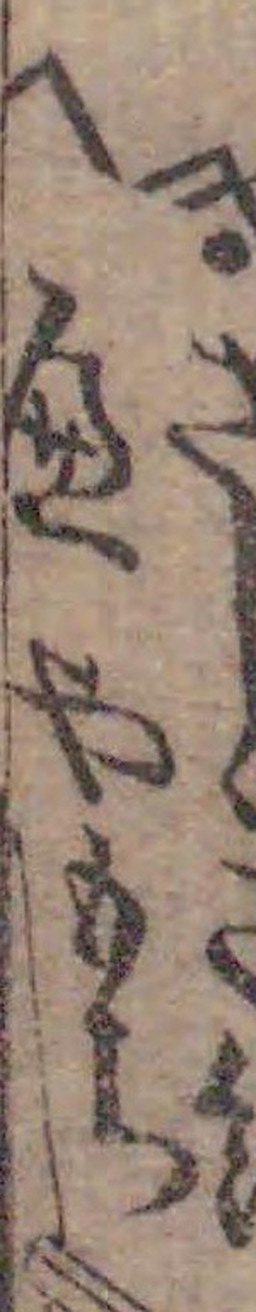へやもち

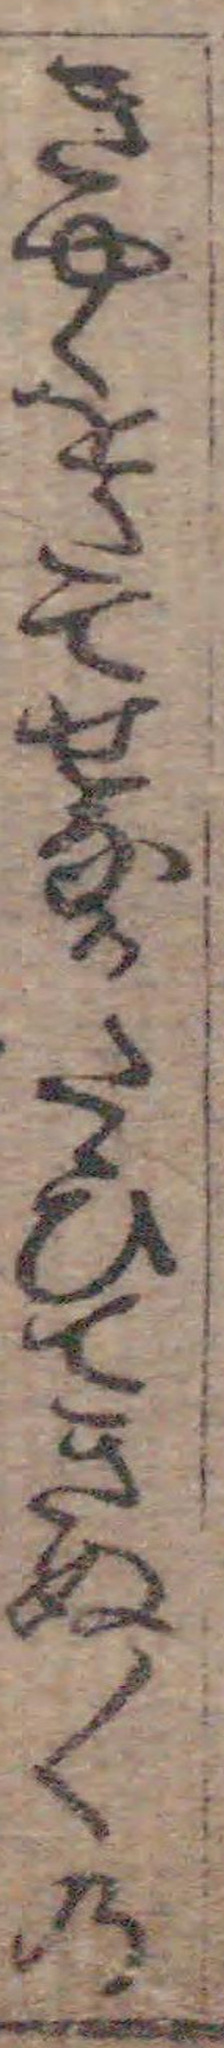きやくをたてせなかたゝひてきぬ〳〵の
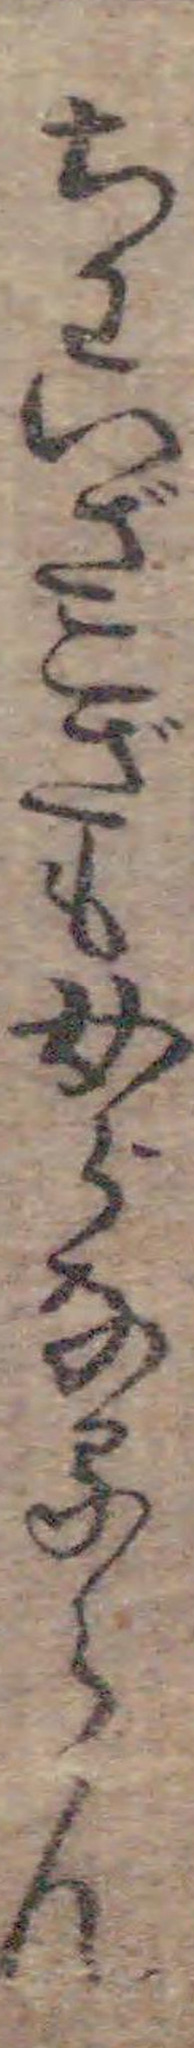ちわいざこざも女郎なるらん
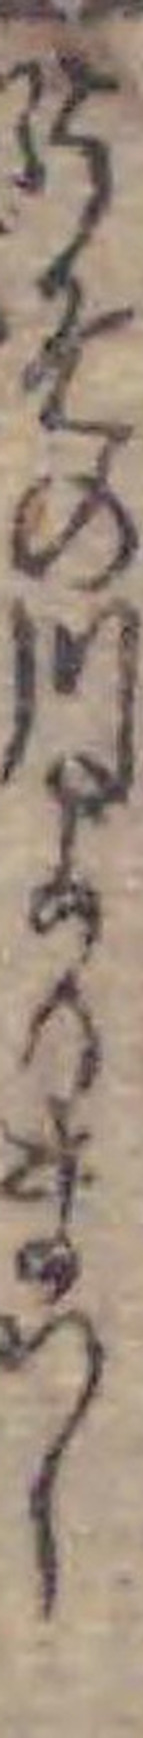うその川よりまはし
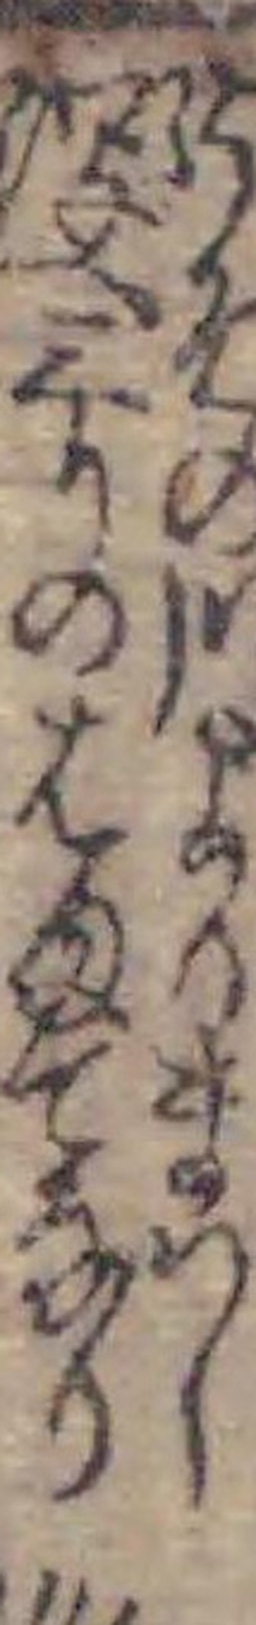潟へ三りのはまてなり
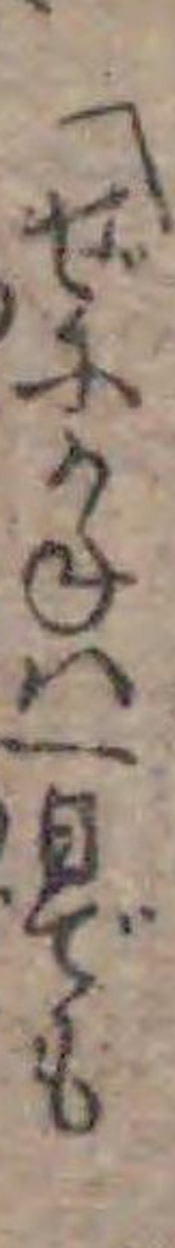〽ぜにかねは一日でも
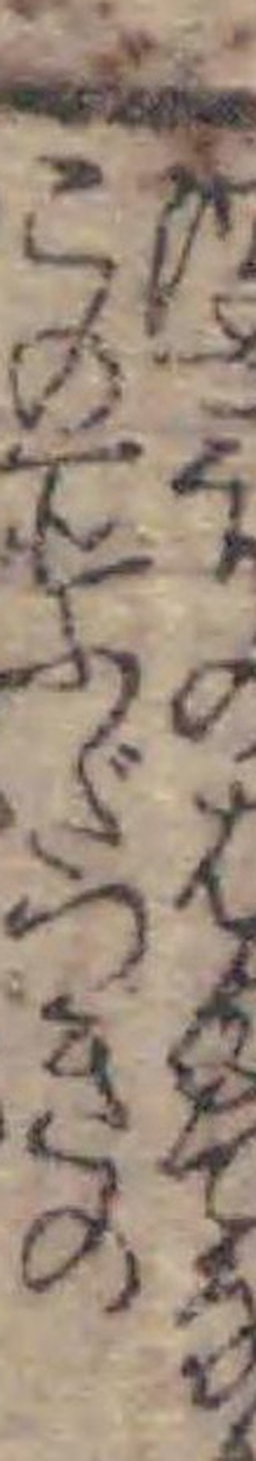この所ふだつきの
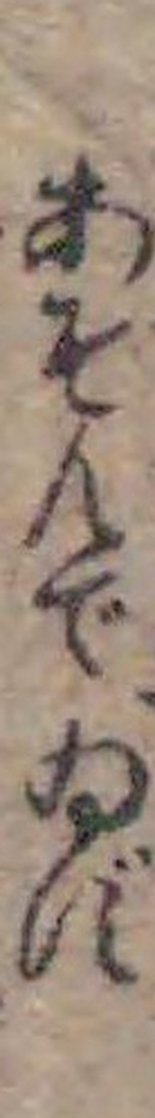あそんでゐず
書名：北国順礼唄方便 : 3巻
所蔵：国立国会図書館 National Diet Library, JAPAN
